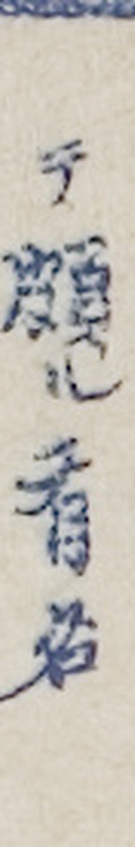テ頗ル有名
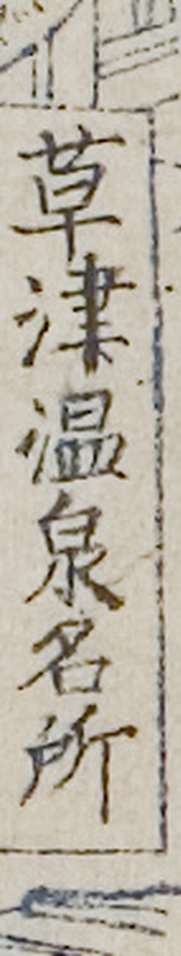草津温泉名所
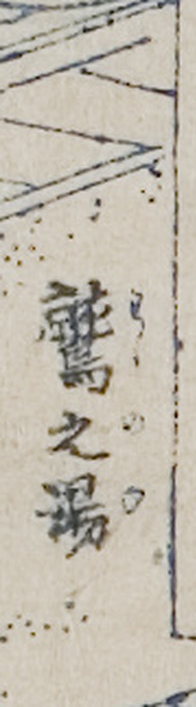鷲之湯
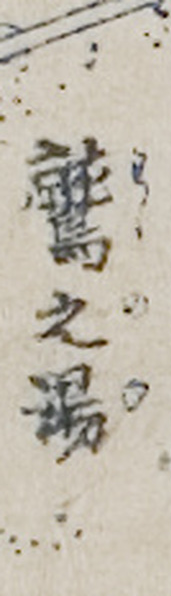鷲之湯
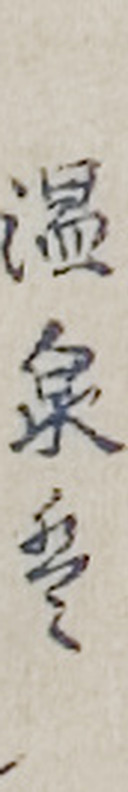温泉は
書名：地獄谷温泉明夜樓眺望之図
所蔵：東京大学総合図書館 General Library in the University of Tokyo, JAPAN
